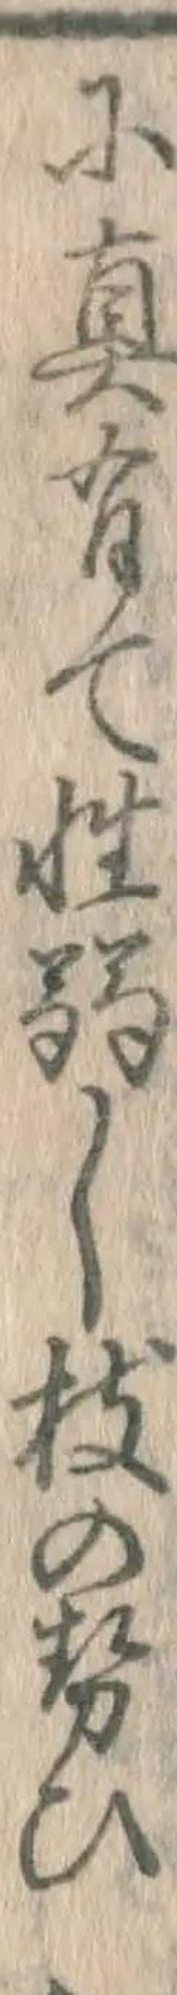に真有て性弱し枝の勢ひ
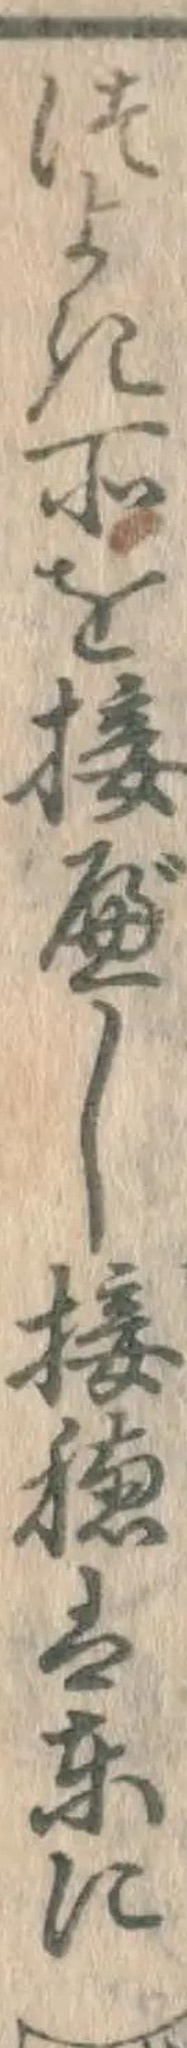つよき所を接べし接穂は東に
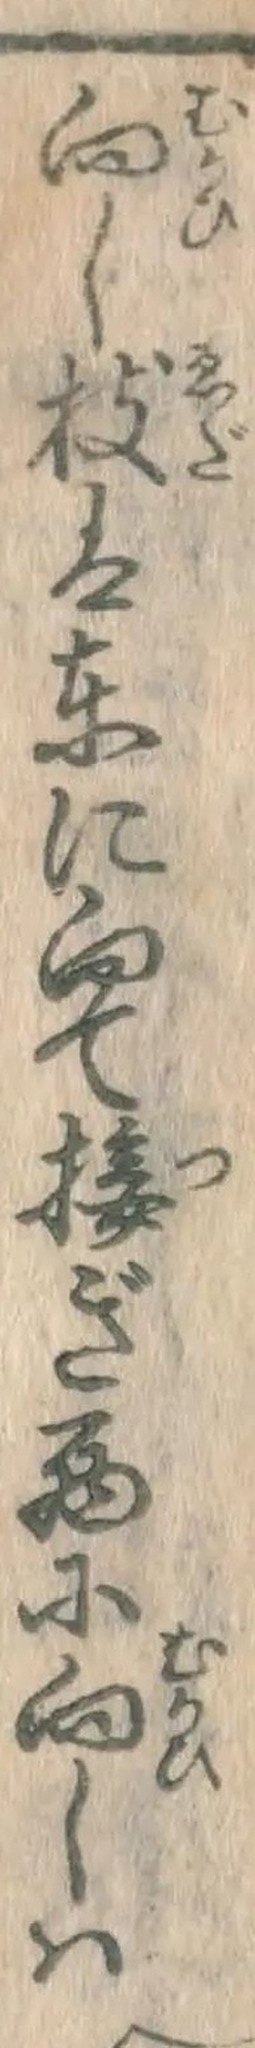向し枝は東に向て接ぎ西に向しは

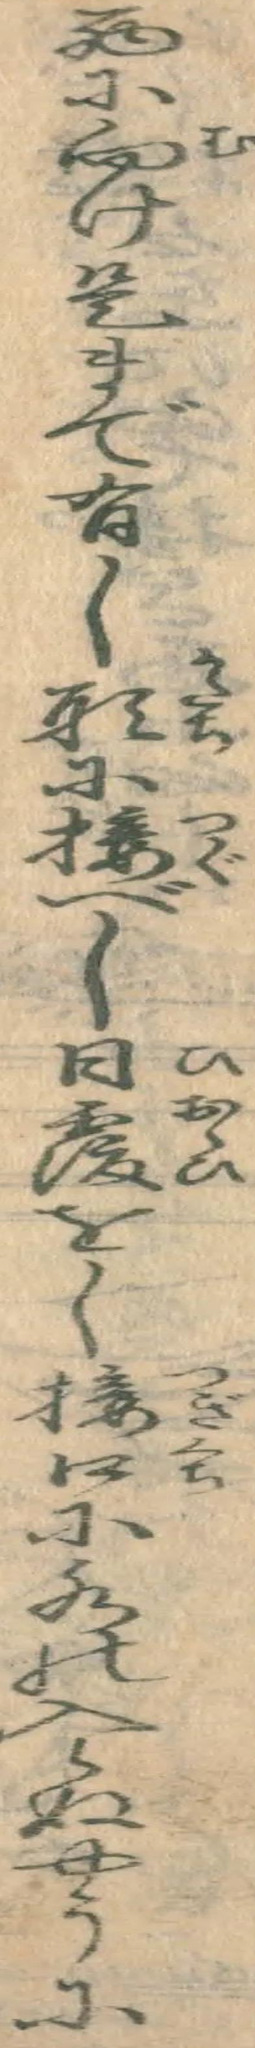西に向け是まで有し形に接べし日覆をし接口に水の入らぬやうに
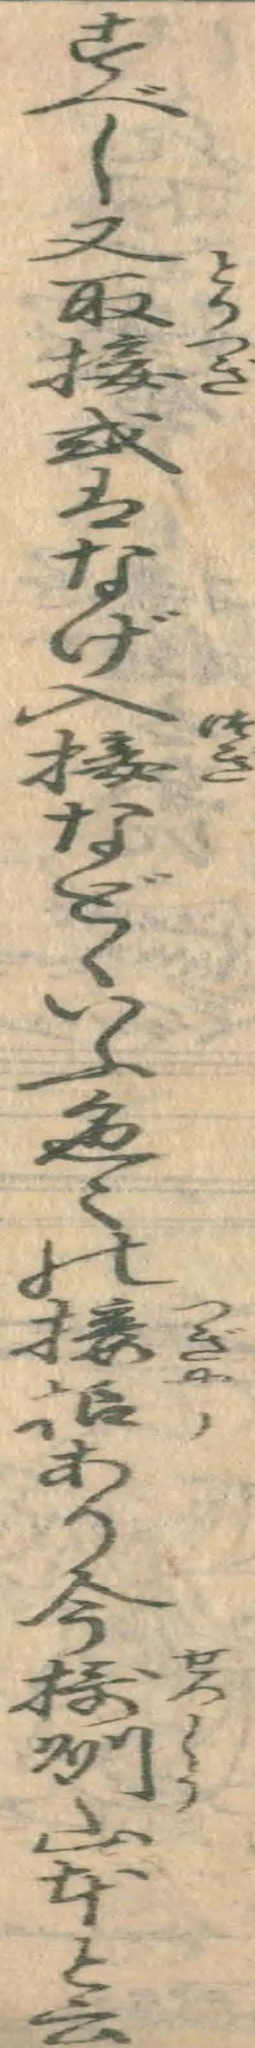すべし又取接或はなげ入接などゝいふ色々の接様あり今摂州山本と云
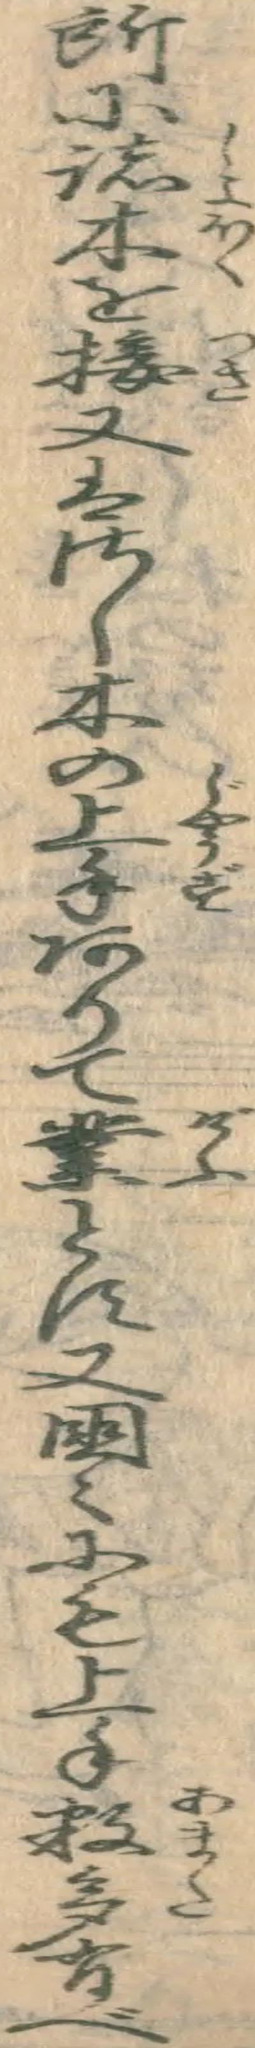所に諸木を接又はさし木の上手ありて業とす又国々にも上手数多有べ
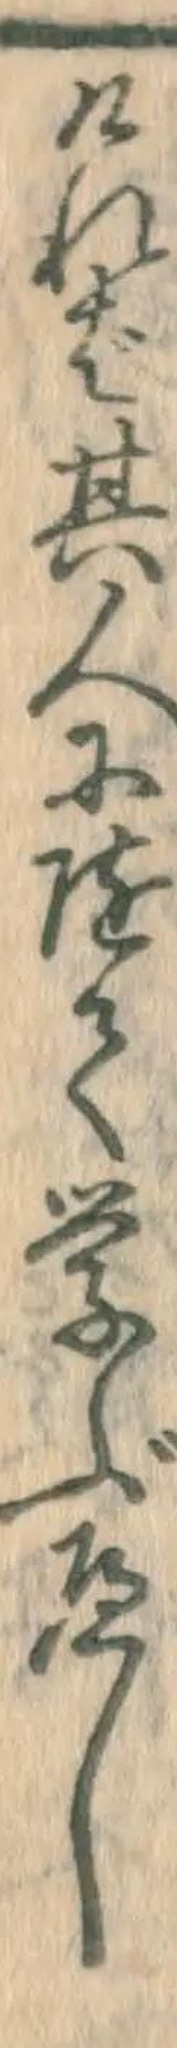ければ其人に随て学ぶへし
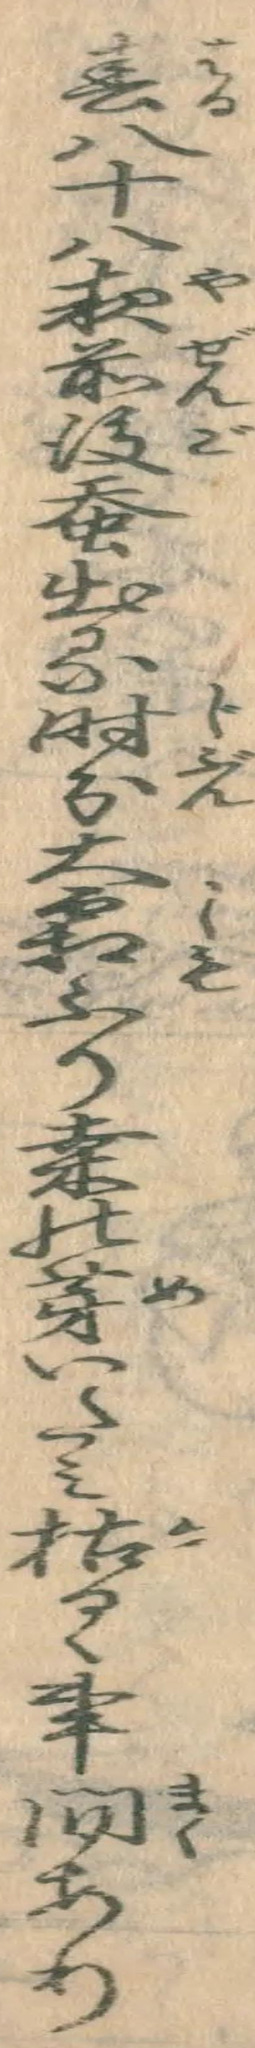春八十八夜前後蚕出る時分大霜ふり桑の芽いたみ枯るゝ事間あり
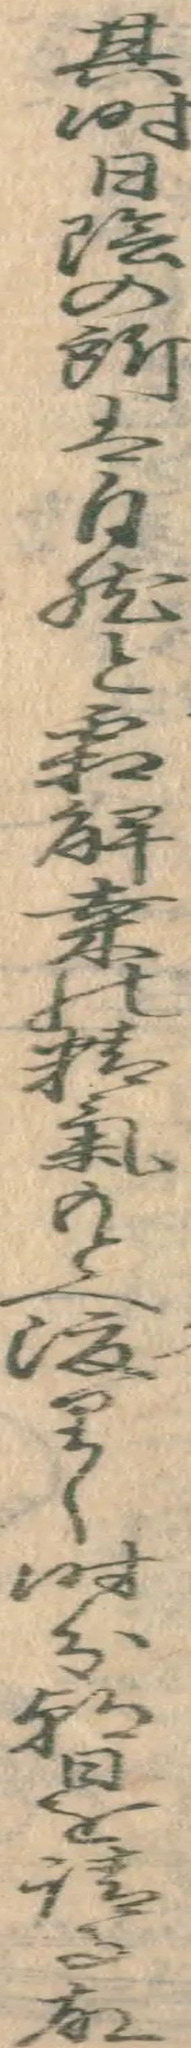其時日陰の所は自然と霜解桑の精気もとへ復りし時分朝日を請る故
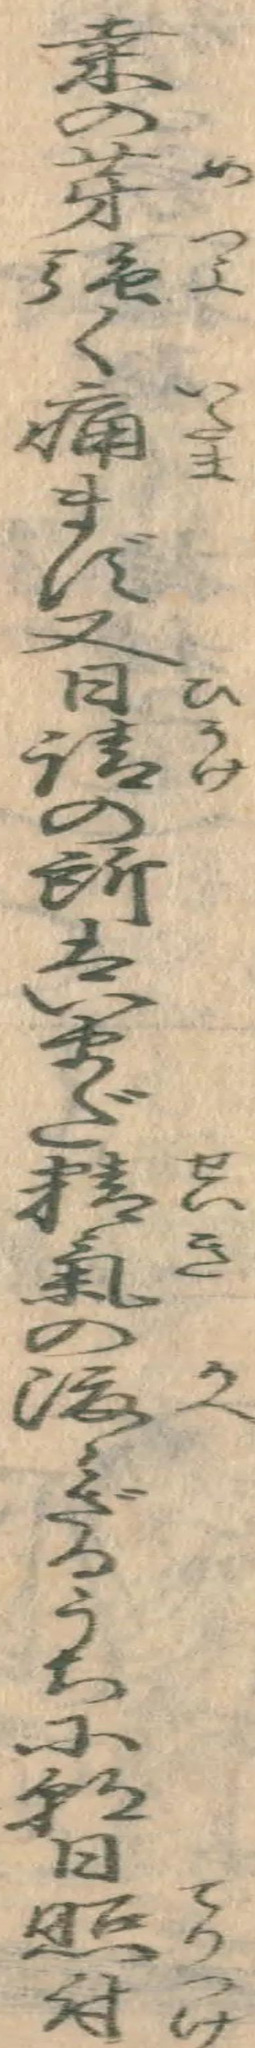桑の芽強く痛まず又日請の所はいまだ精気の復らざるうちに朝日照付
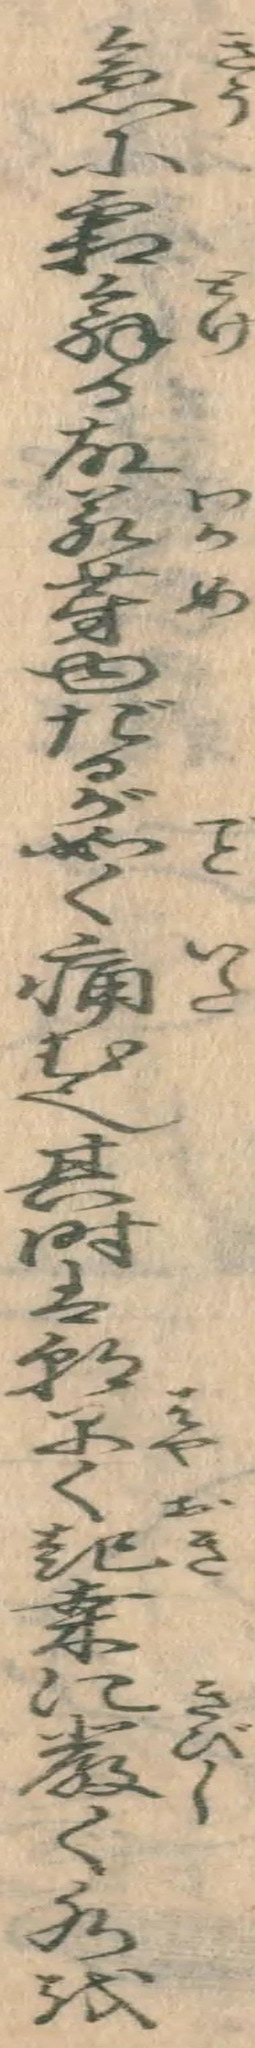急に霜解る故若芽ゆだるが如く痛む也其時は朝早く起桑に厳く水を
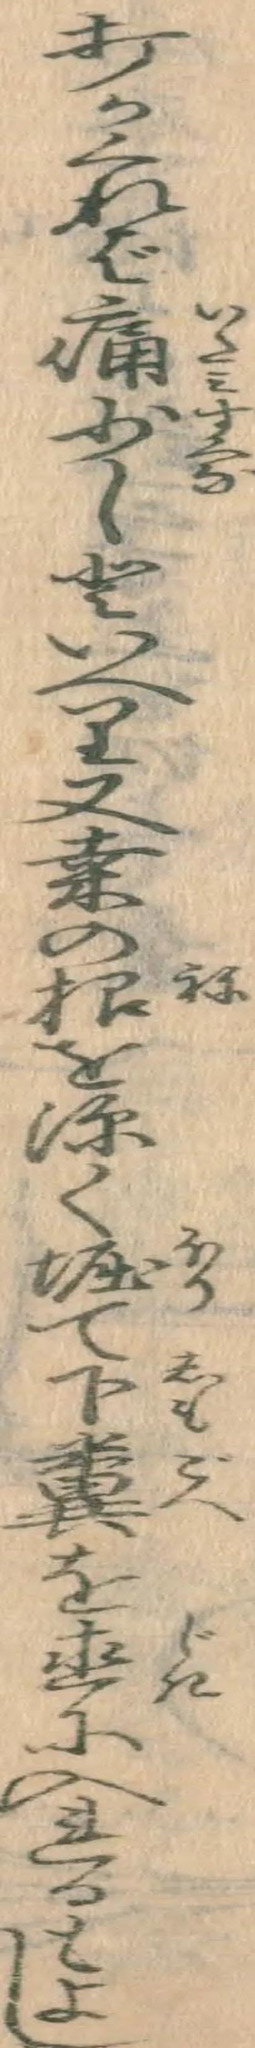打かくれば痛少しといへり又桑の根を深く堀て下糞を直に入れるもよし
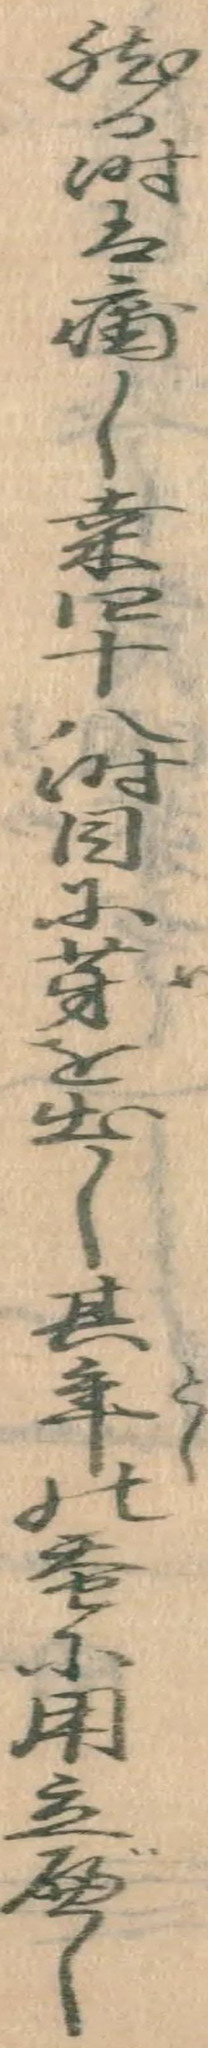然る時は痛し桑四十八時目に芽を出し其年の蚕に用立べし
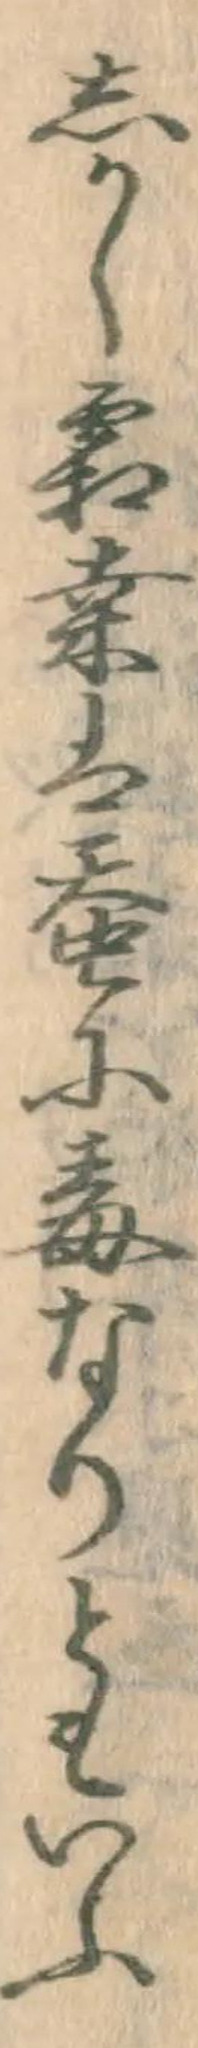しかし霜桑は蚕に毒なりともいふ
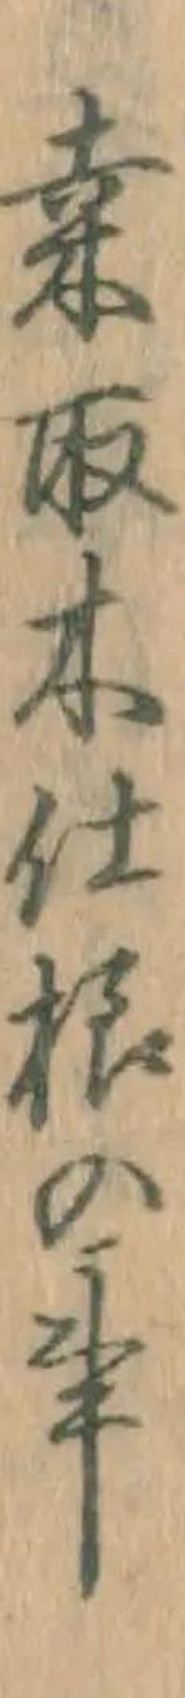桑取木仕様の事
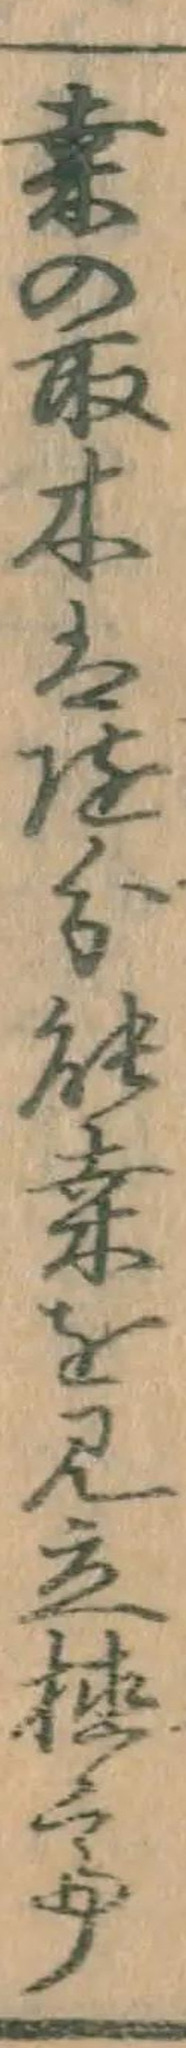桑の取木は随分能桑を見立植て
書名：養蚕秘録 3巻. [1]
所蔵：国立国会図書館 National Diet Library, JAPAN
